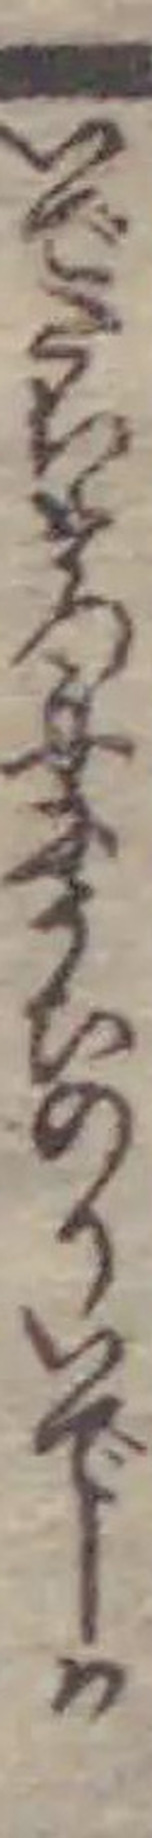いでたちまつ舟にうちのりいでしか
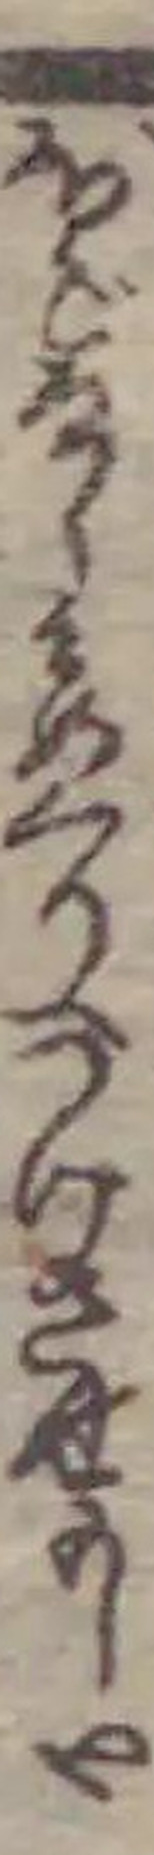ほどなくみめくりへつけさせもしや
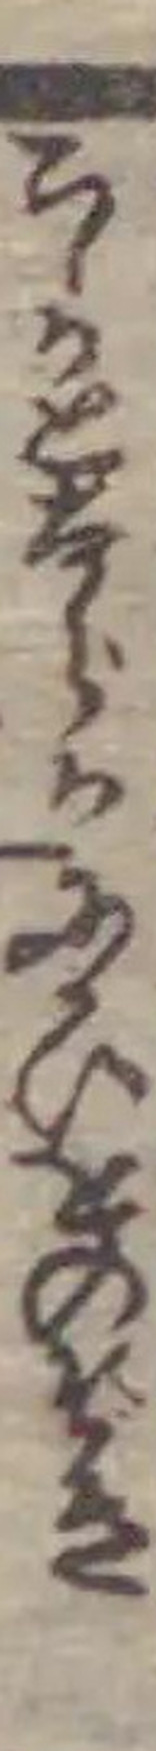ここかと太郎かにかひをのぞき
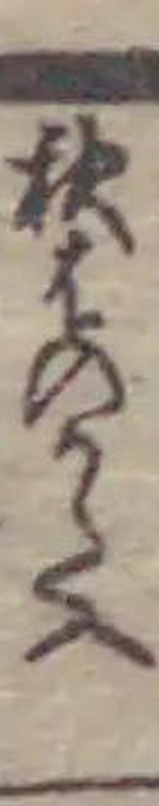秋はのかたへ
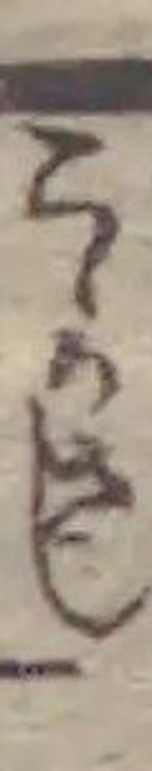こゝろさし
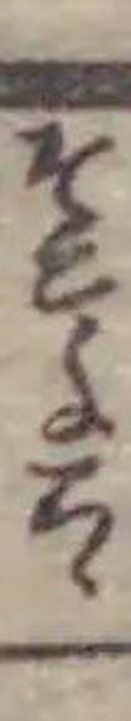そこよこゝ
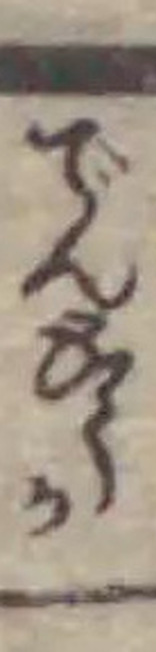でんとうか
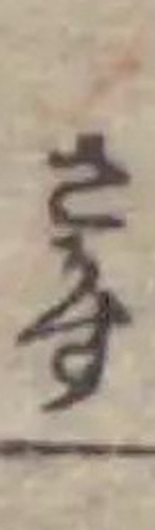さかす

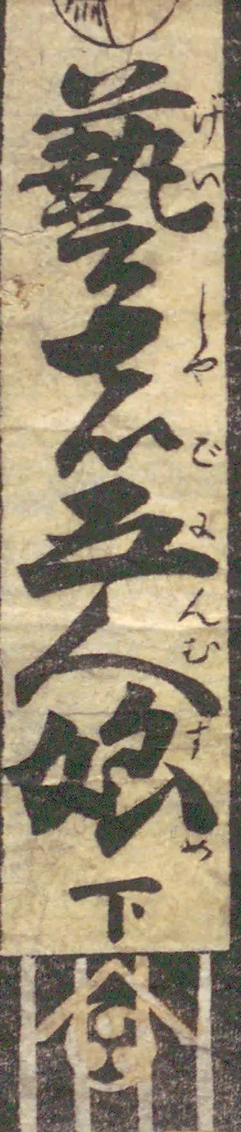藝者五人娘下

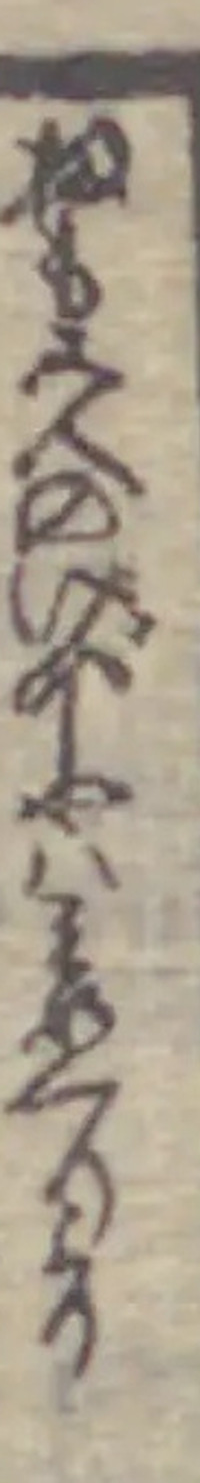扨も五人のげいしやはみめくりより
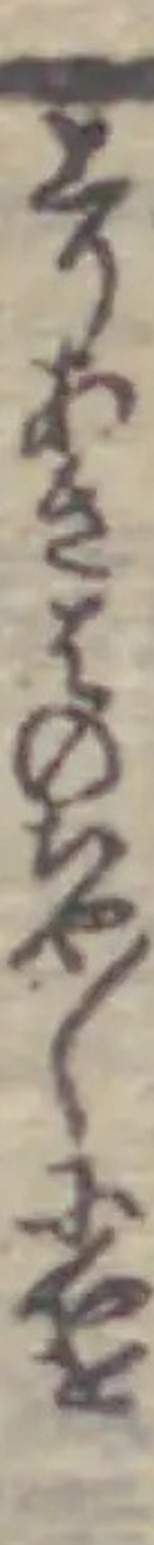上りあきはのちやゝに心を
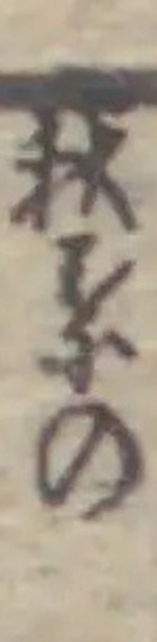秋葉の
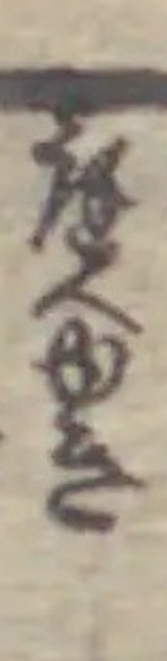庭へゆき
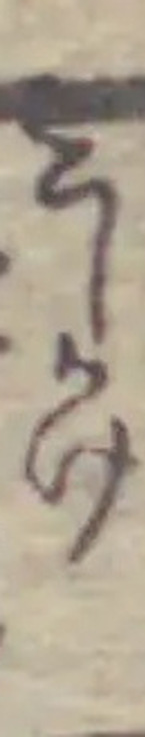こしかけ
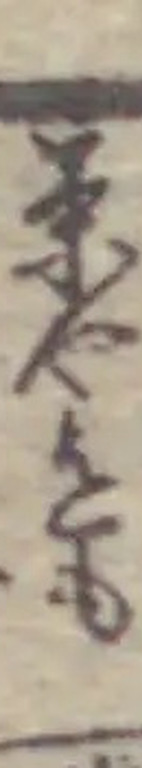茶やをも
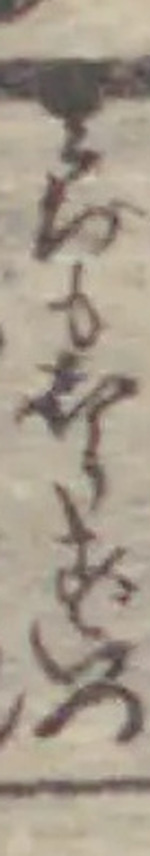みちも知らずいつ
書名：藝者五人娘 2巻
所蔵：国立国会図書館 National Diet Library, JAPAN
